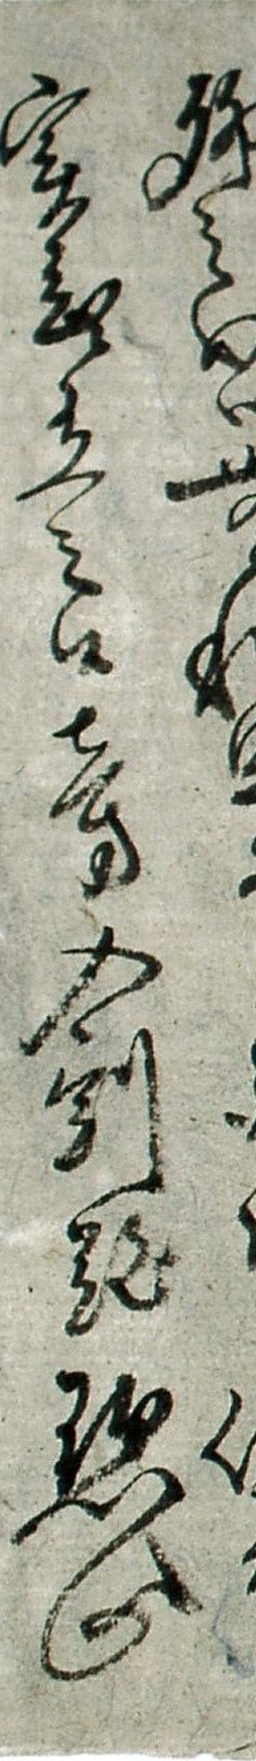実意に有之候旁入割難黙止
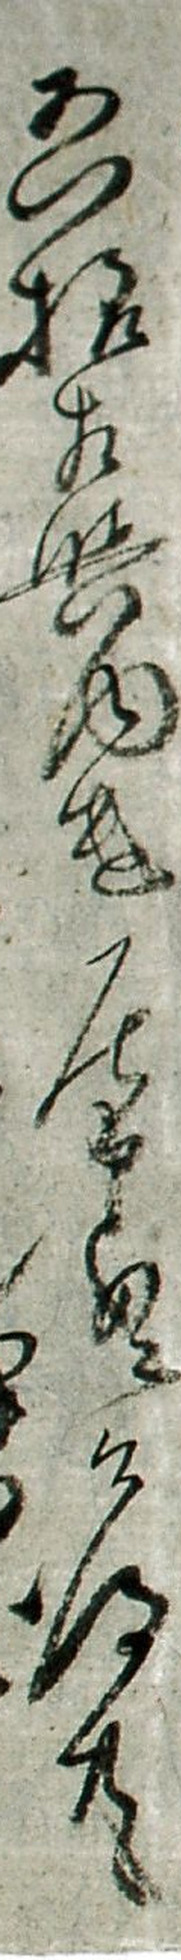右様相与内遣居申義に候得共
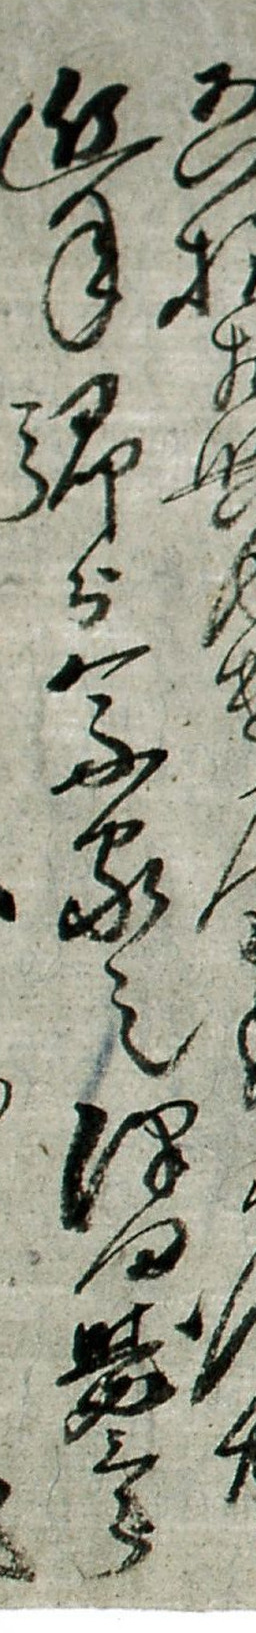近年郷分富家之沢田覚三郎
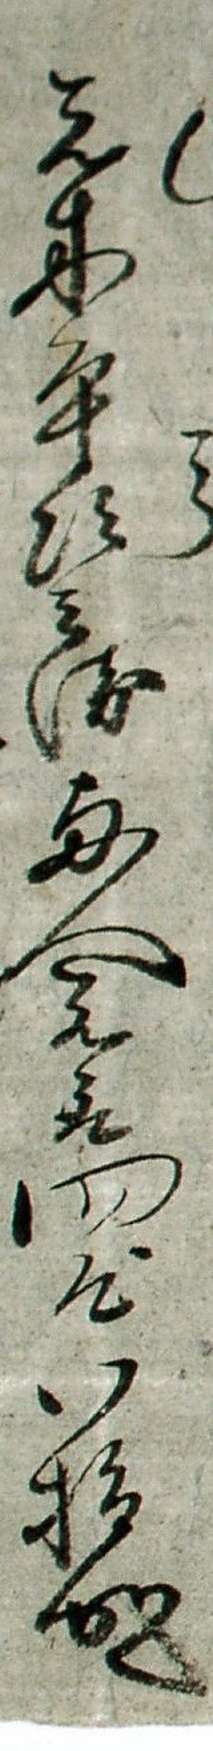元木平次兵衛両人元取問屋御指加へ
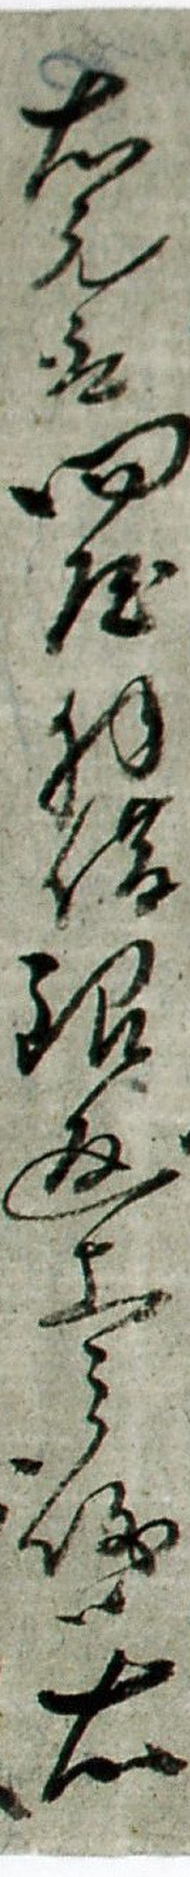右元取問屋拝借銀返上之儀は右
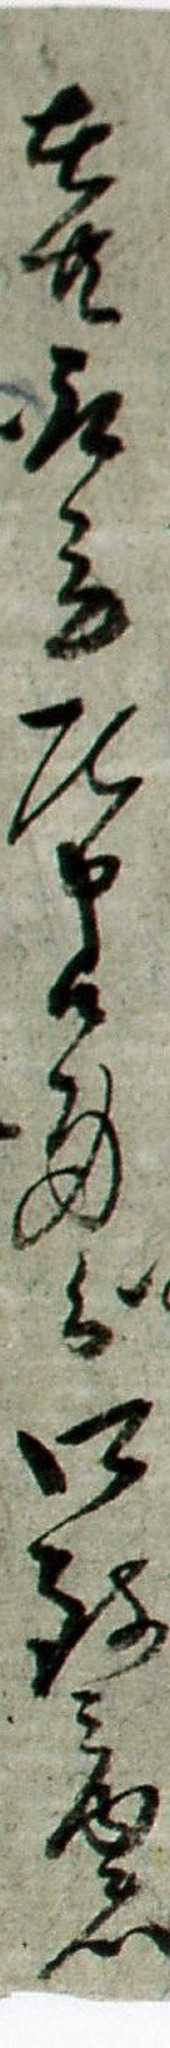者共取立居申候身分口銭之内を以
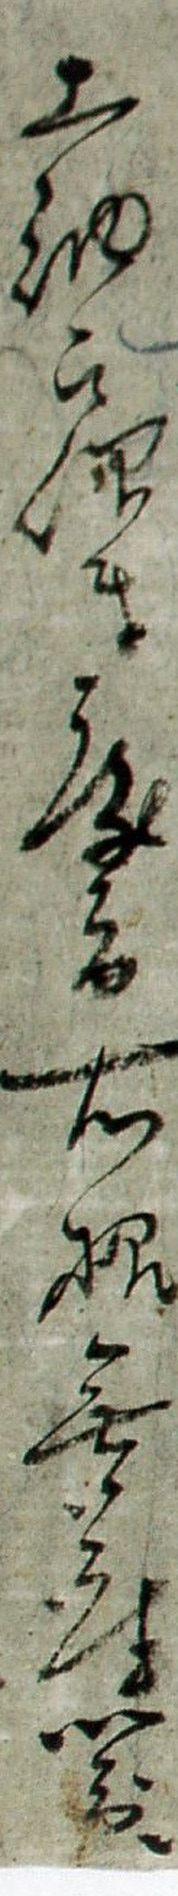上納被仰付度旨右様無御座候以前に

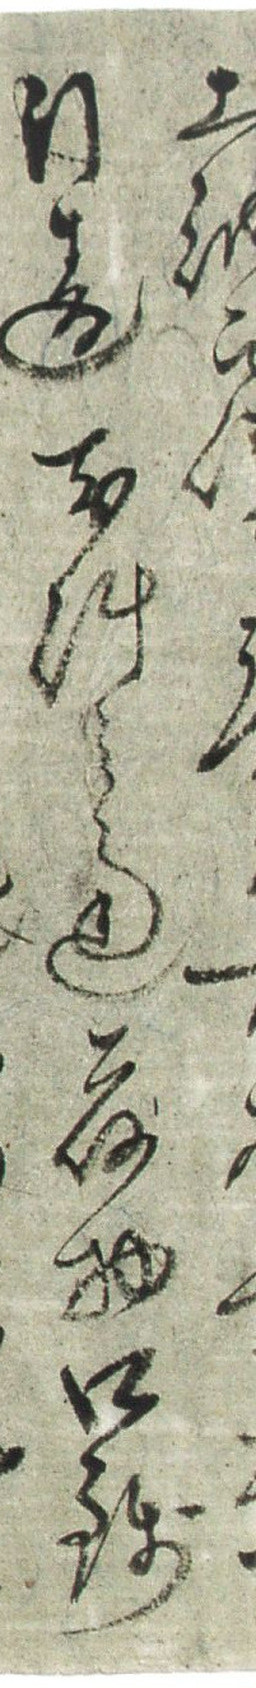行違前件之通荷物口銭
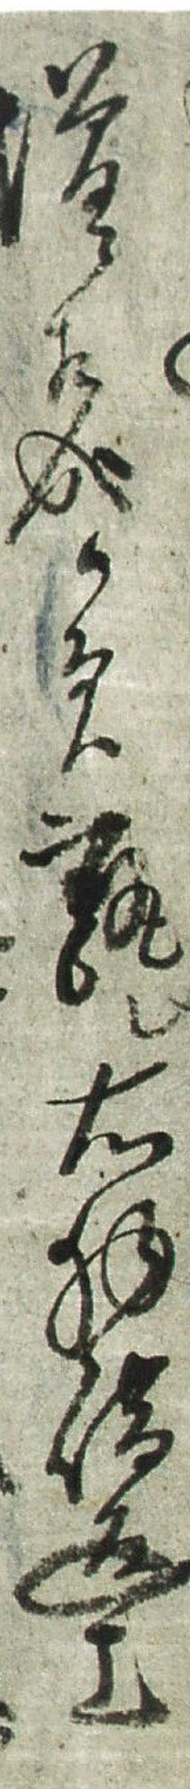増に相成候ては孰れ右拝借返上
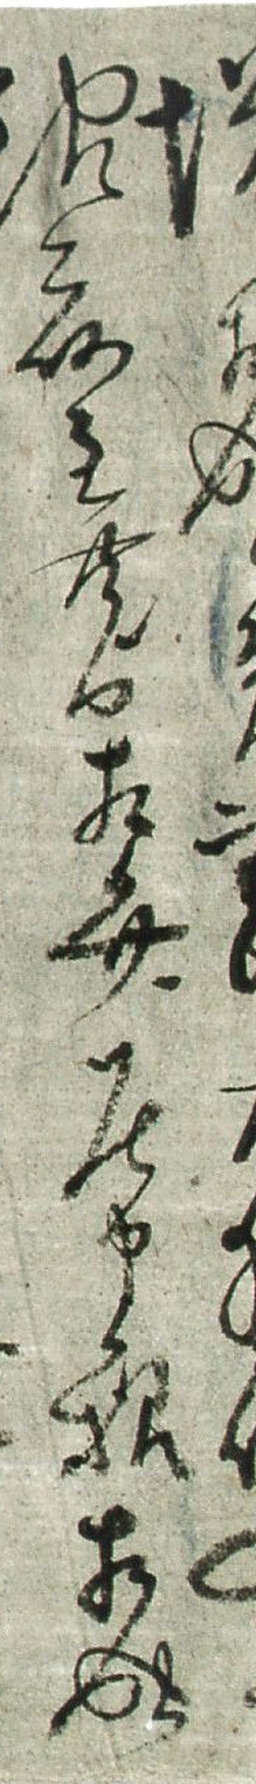銀荷主共ゟ相弁居申候様相成り
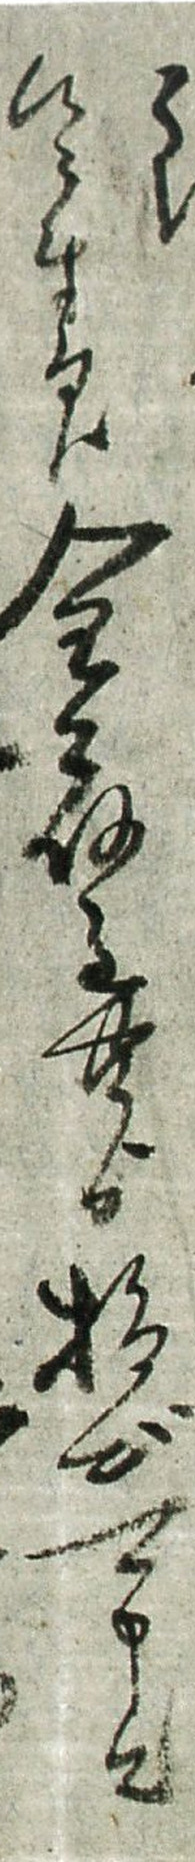候に付ては全荷主共ゟ指出可申候
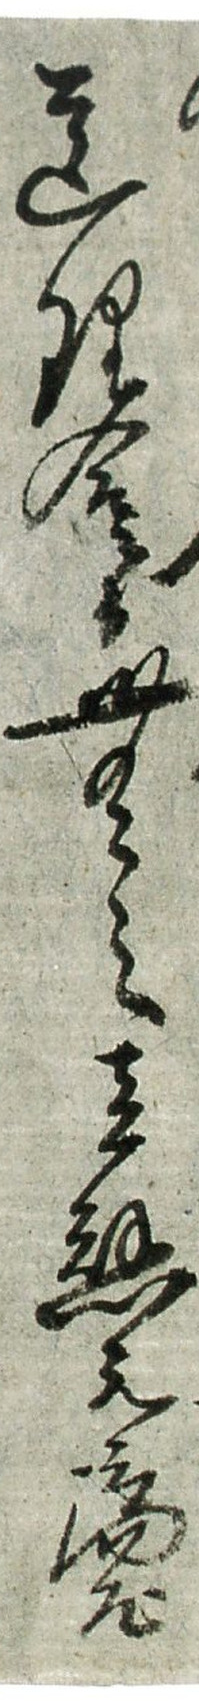道理合にて無之壱応元取問屋
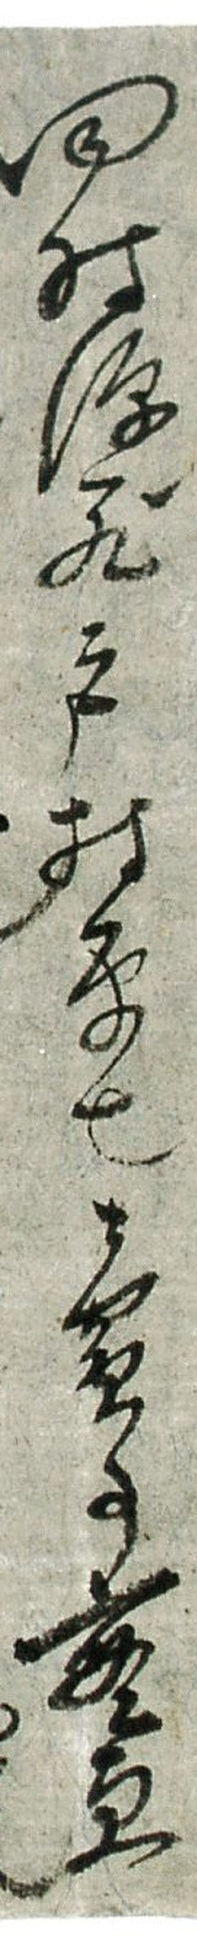田村源蔵戸村平七売事実直
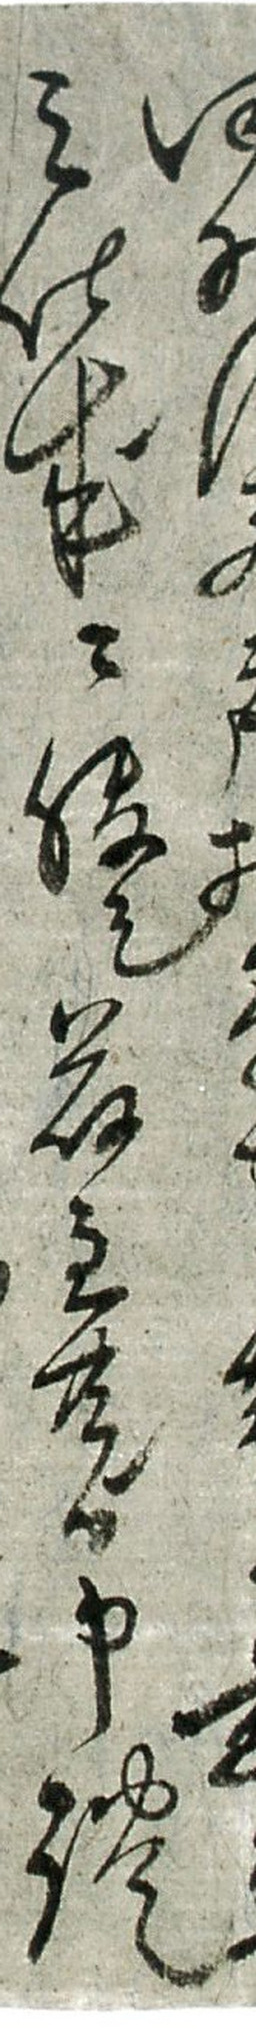之仕成に服し荷主共ゟ申談
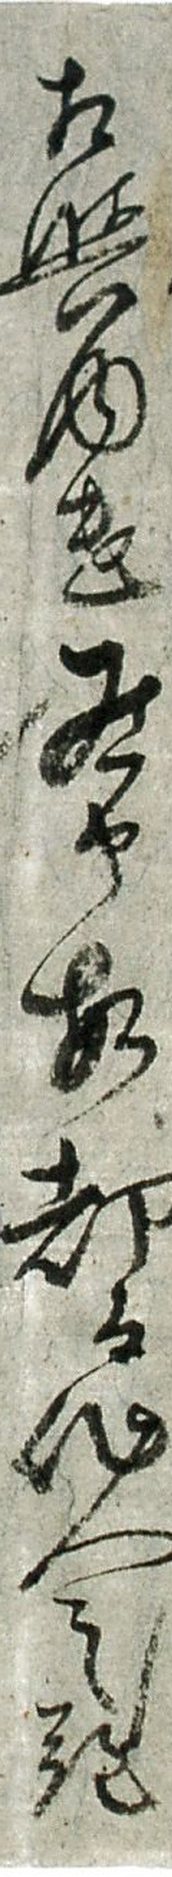相与内遣居申段都て作人之難
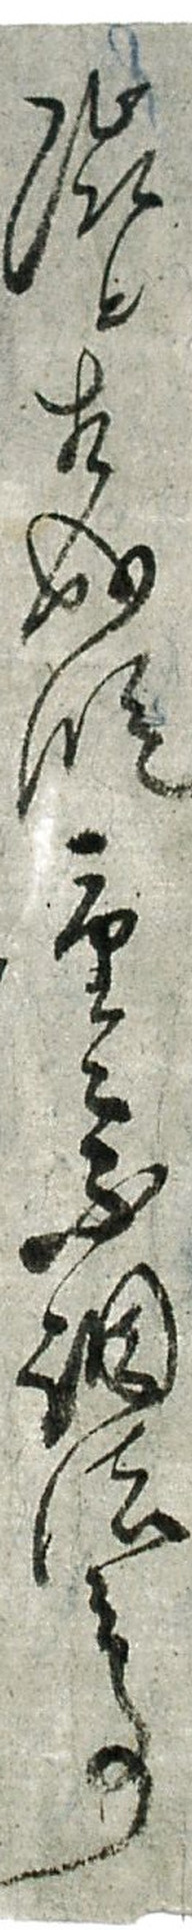渋に相成段重々不調法之事
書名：(美馬三好両郡百姓共煙草問屋壱手勘定ニ相成迷惑願右始末承申上書付之写）
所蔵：鳴門教育大学 Naruto University of Education
